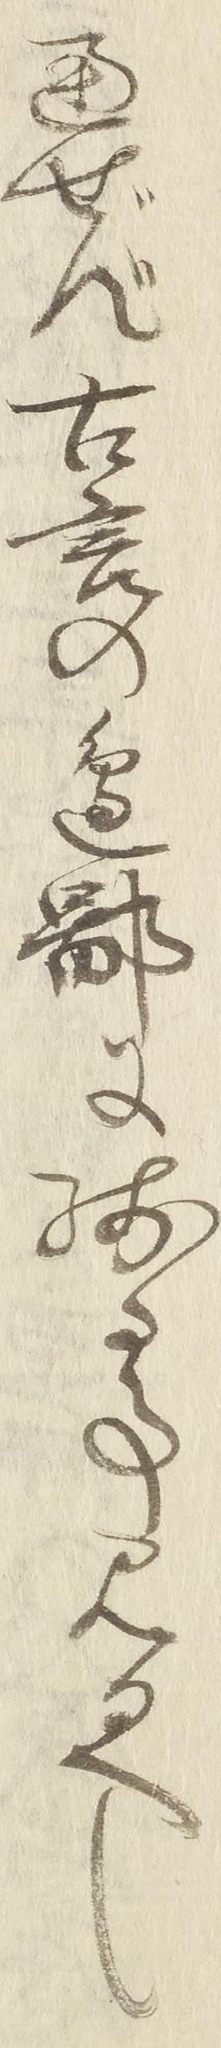通ぜず古言の辺鄙に残る事見るべし

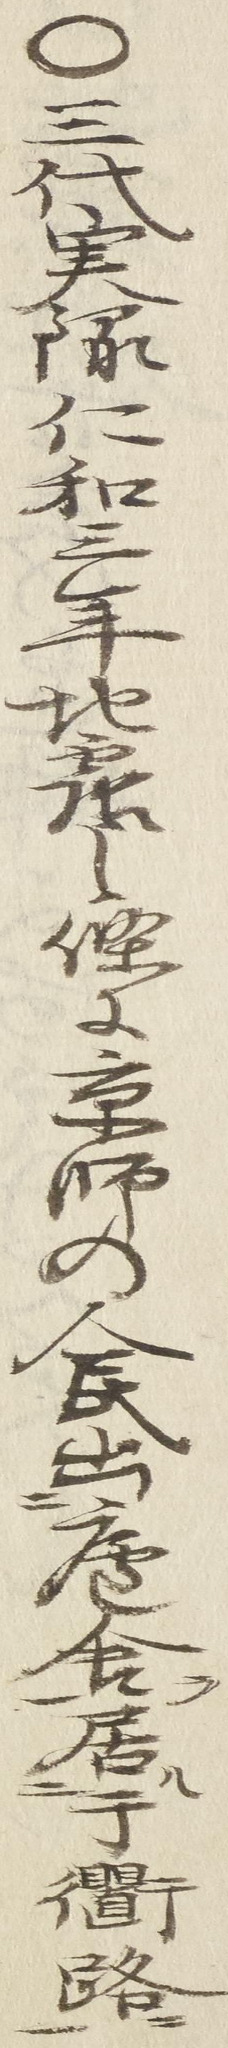○三代実録仁和三年地震之條に京師の人民出廬舎を居る于衢路に
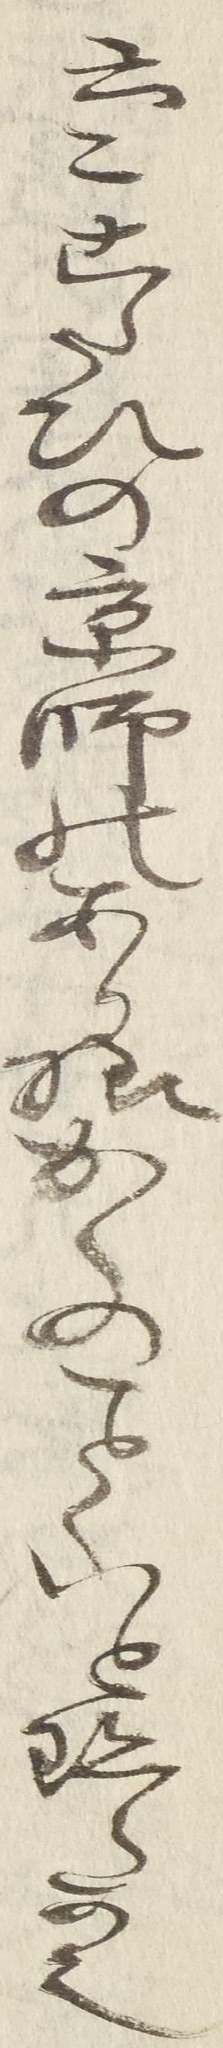云々こたひの京師のあり様かくのごとくいと珍らか也
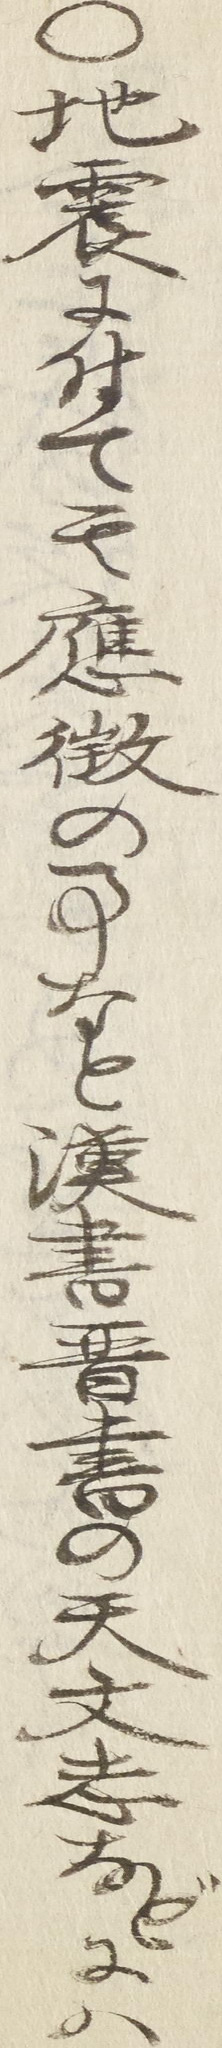○地震に付て其応-徴の事などは漢書晋書の天文志などには
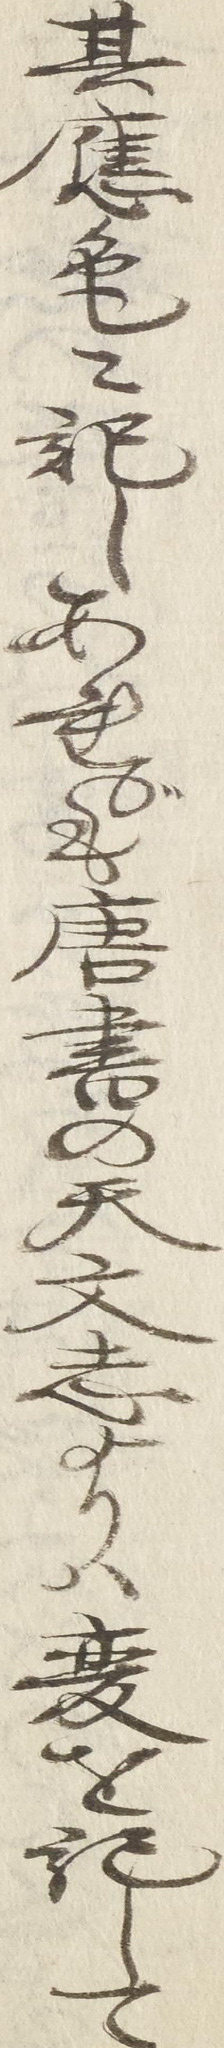其応色々記しあれども唐書の天文志よりは変を記して
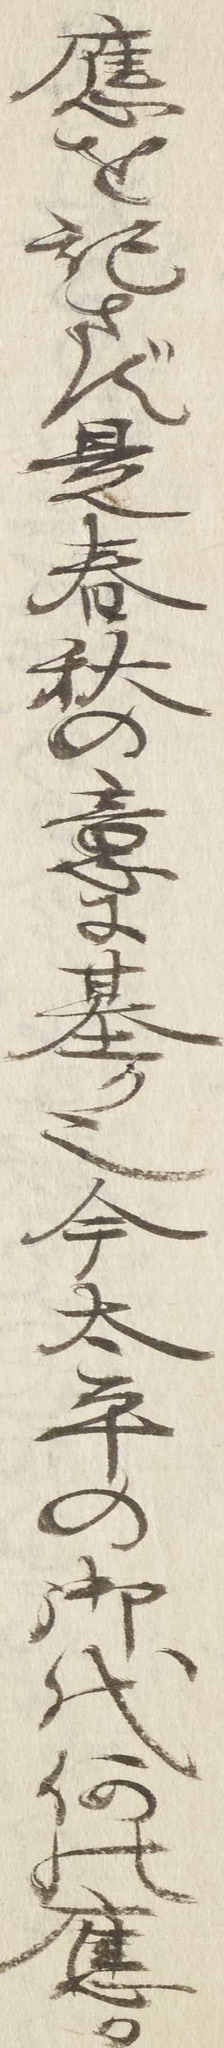応を記さず是春秋の意に基く也今太平の御代何の応か
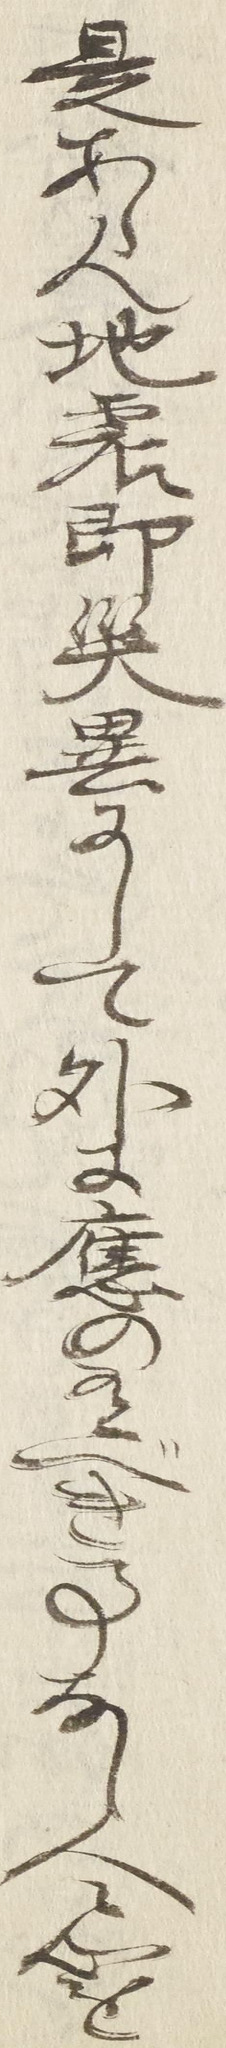是あらむ地震即災異にして外に応の有べき事なし人々心を
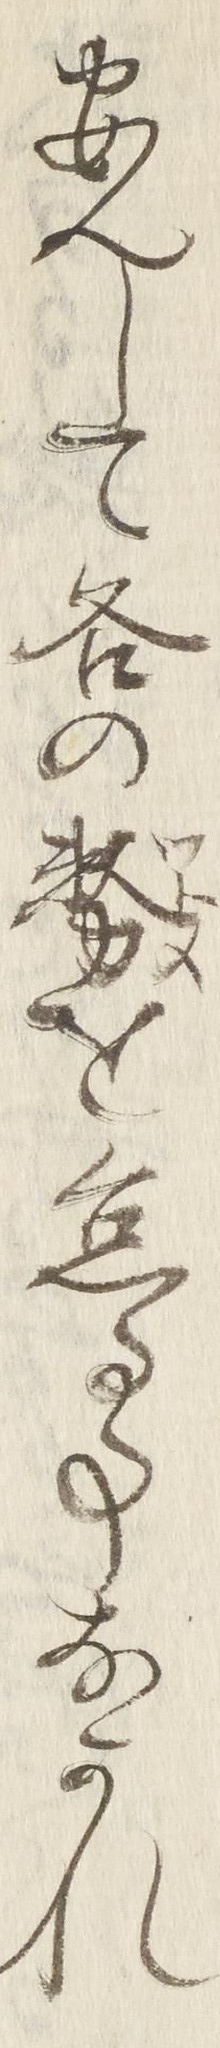安んして各の務を怠る事なかれ
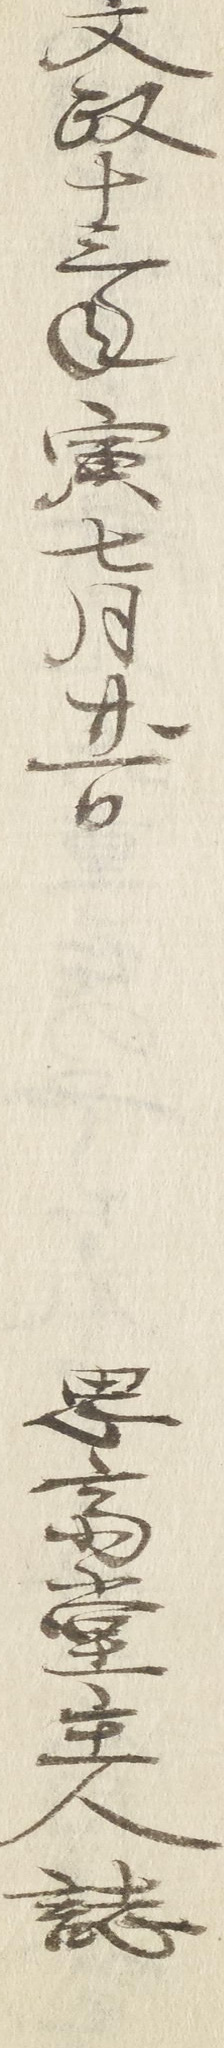文政十三年寅七月廿一日思齋堂主人誌
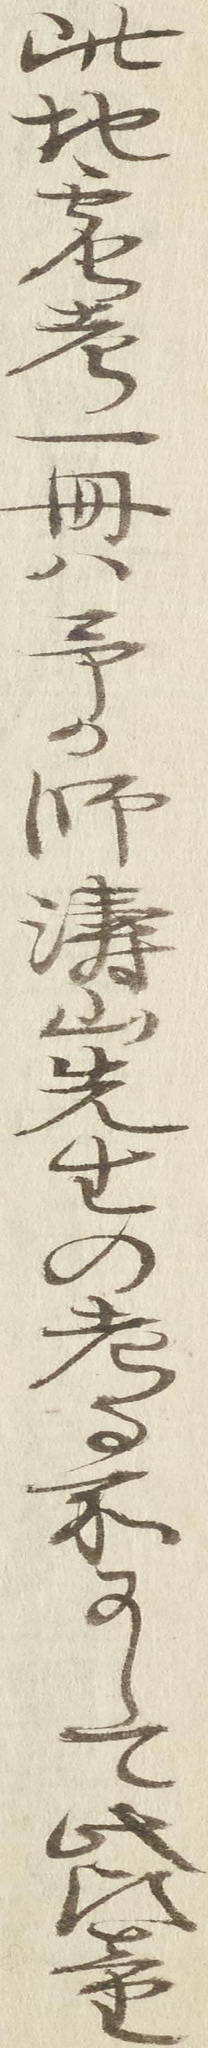○此地震考一冊は予か師涛山先生の考る所にして此頃童
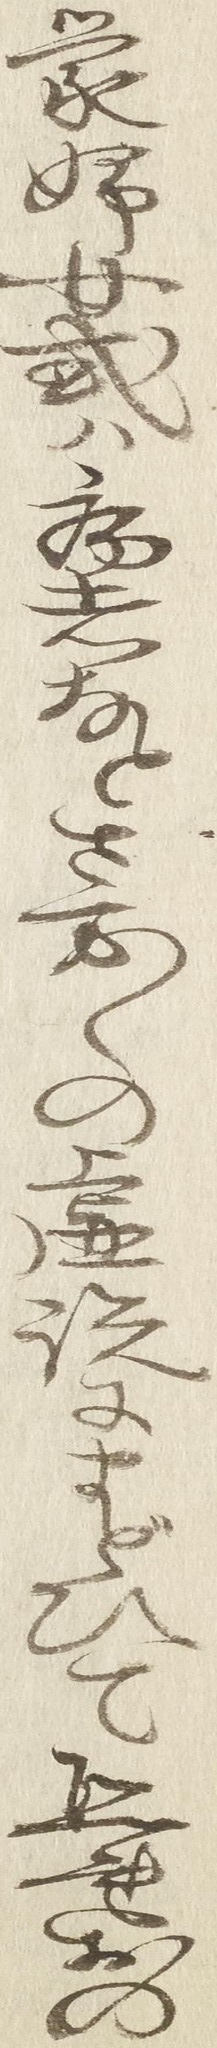蒙婦女或は病者なとさま〳〵の虚説にまどひて恐れおの
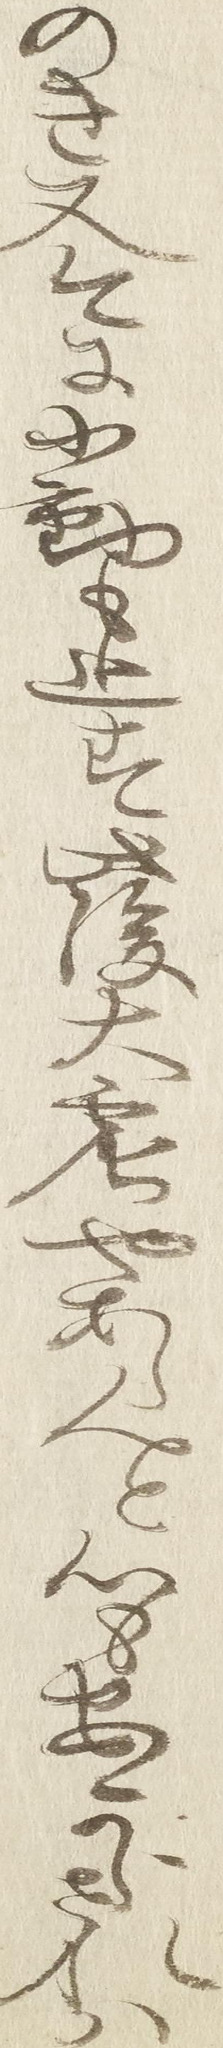のき又今に小動も止ず此後大震やあらんと心も安からざれは
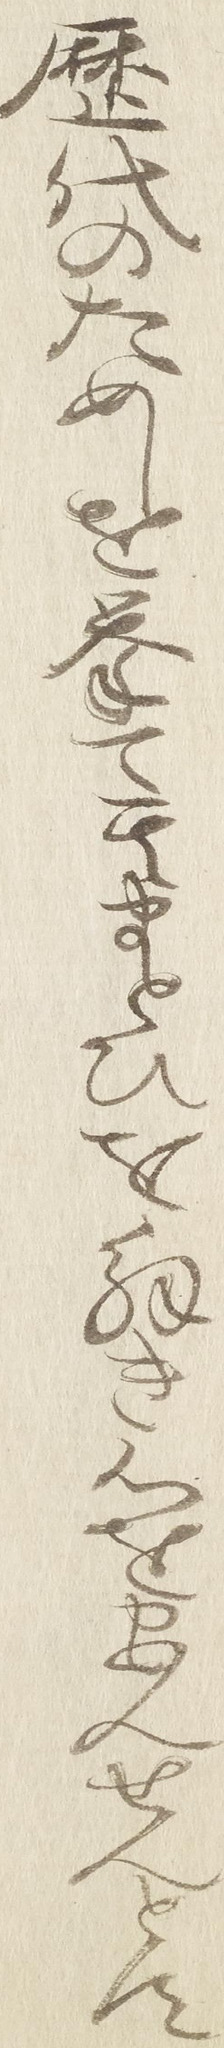歴代のためしを挙て其まとひを解きこゝろを安んせんとす
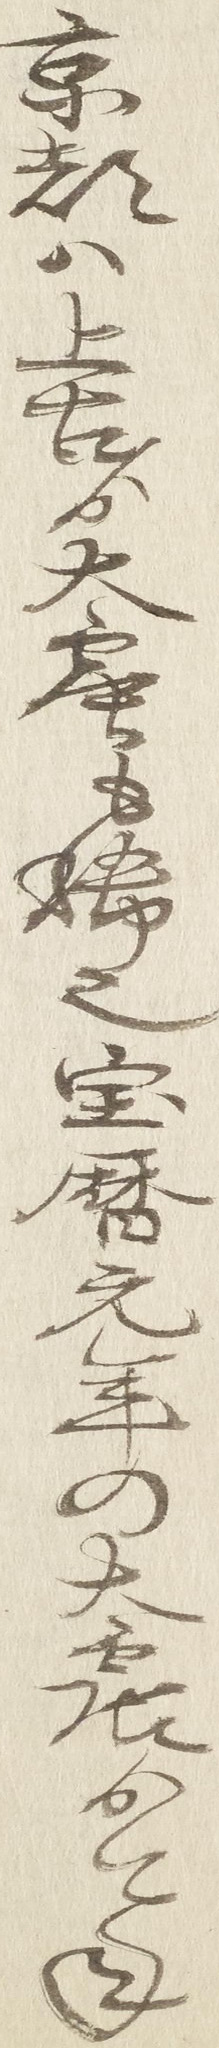京都は上古ゟ大震も稀也宝暦元年の大震ゟ今年
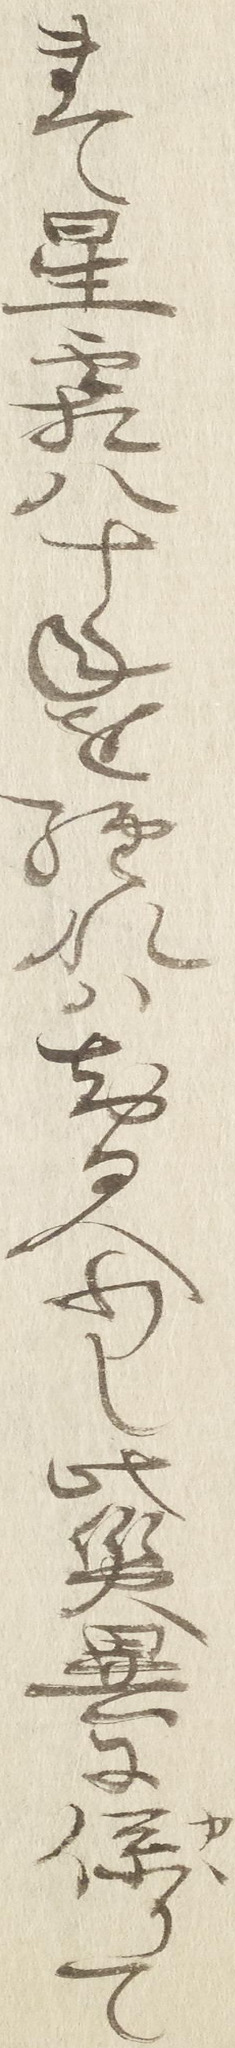まて星霜八十年を経れは知る人少し此災異に係りて
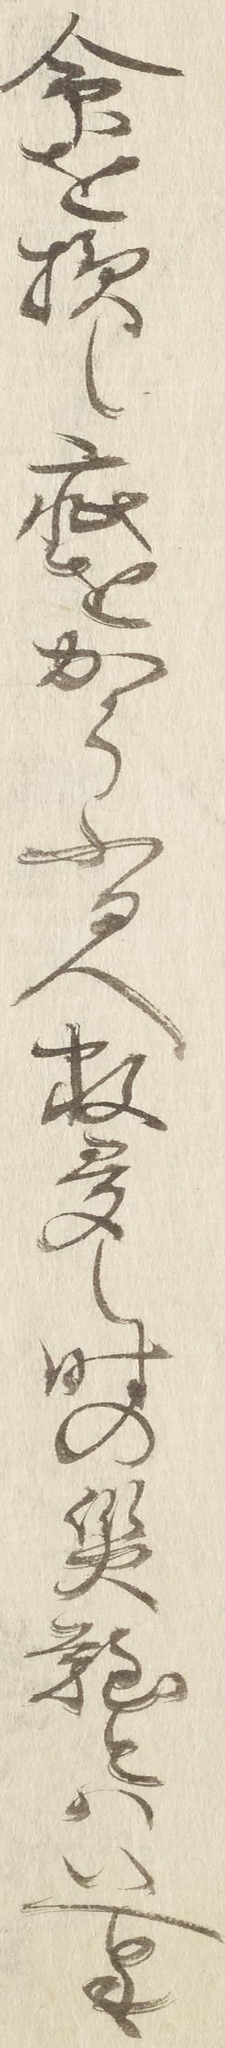命を損し疵をかうふる人数多し時の災難とはいへども
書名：地震記　下
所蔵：東京大学地震研究所図書室 Earthquake Research Institute Library, The University of Tokyo, JAPAN
